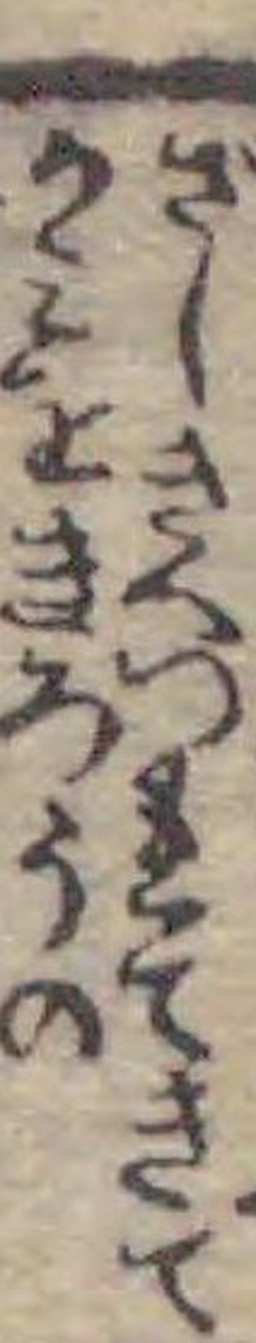かみをきろうの
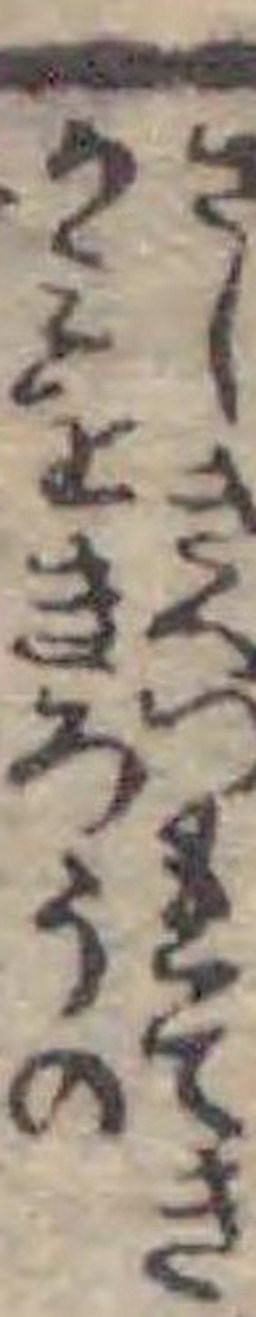かみをきろうの
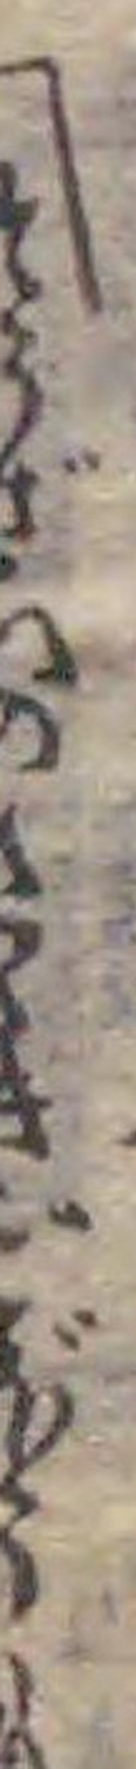〽そうざいのたゝきごぼうも
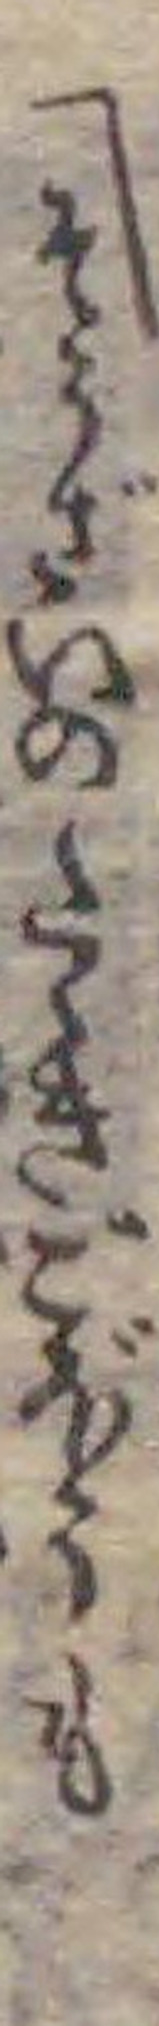〽そうざいのたゝきごぼうも
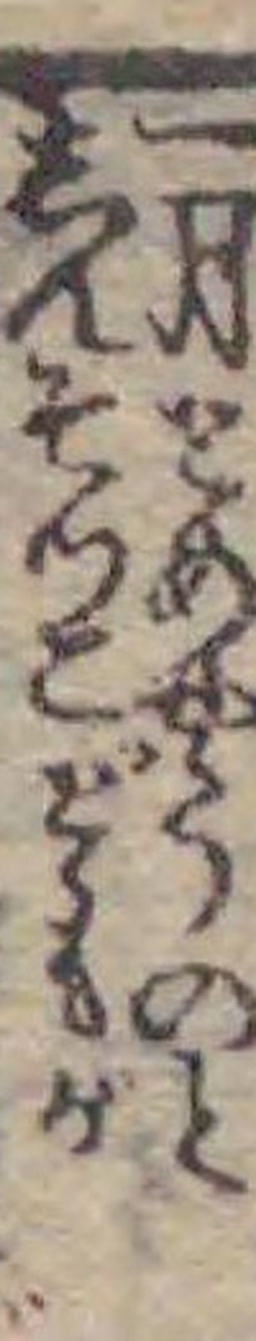しんそつこどもが
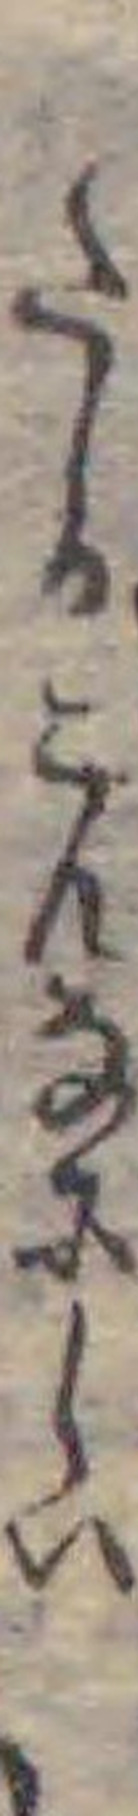たしかこんなにしい
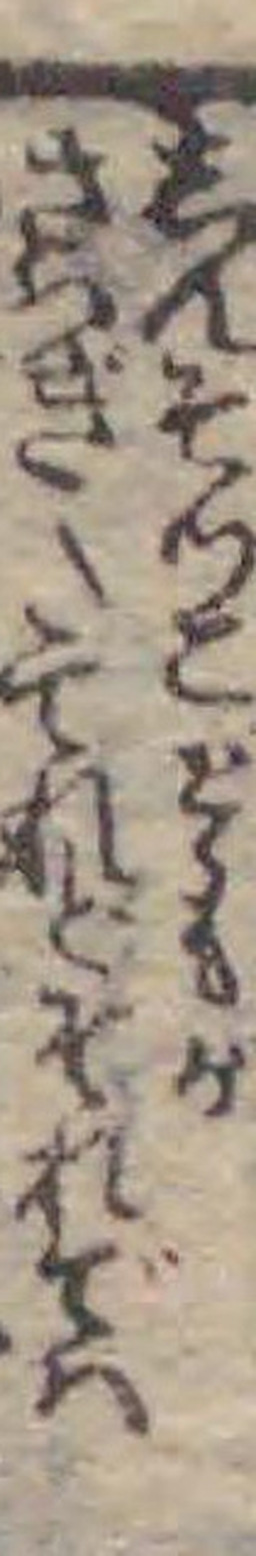さはぎたてれどそれでは
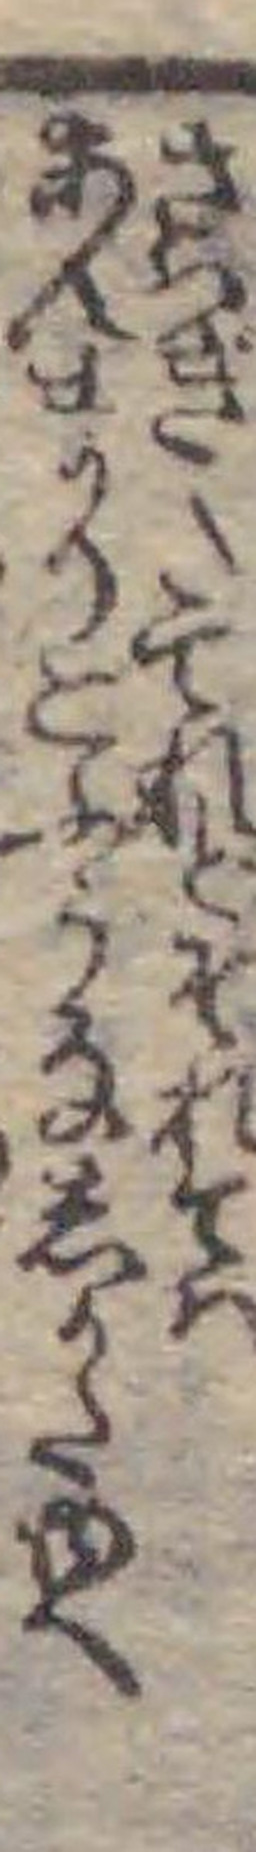あんまりこふうなしかたゆへ
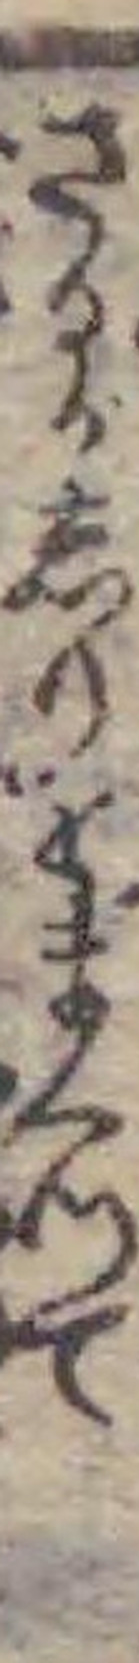さるがしりをまくつて
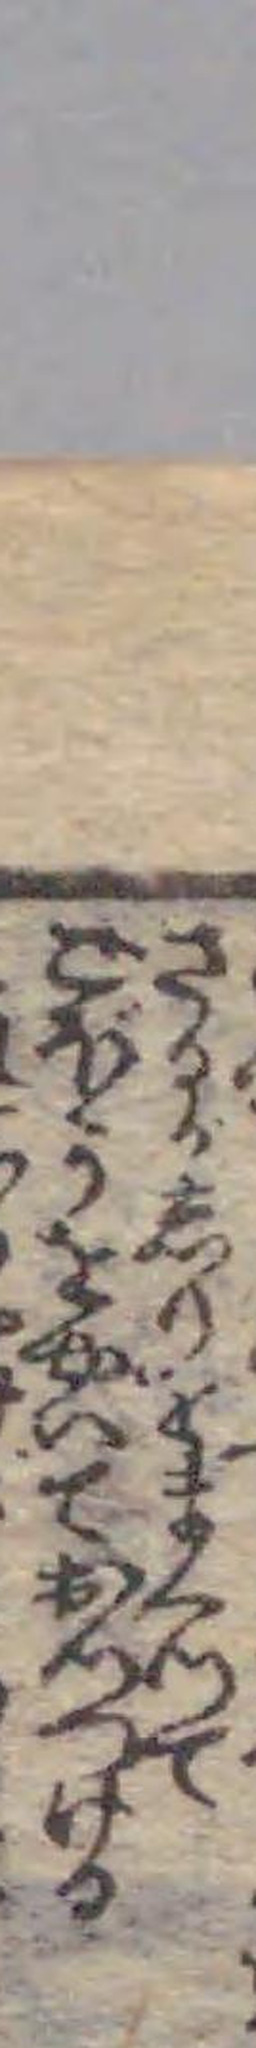ごぼうをやいておつつける
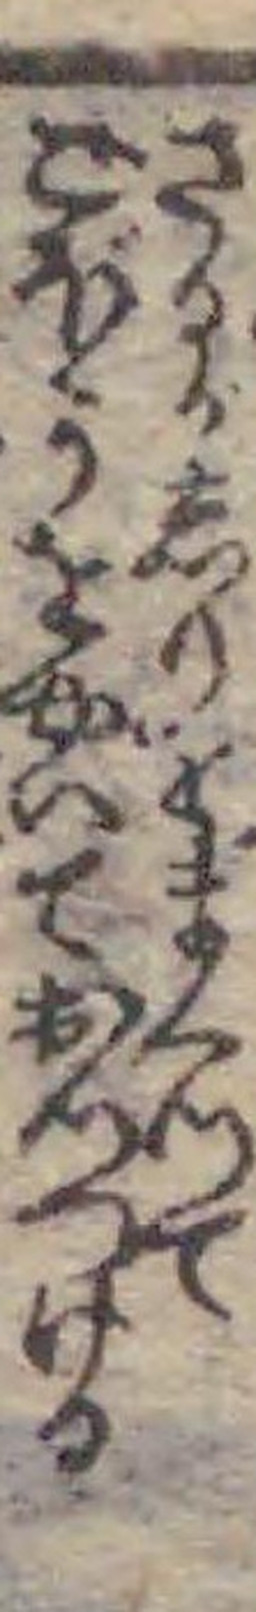ごぼうをやいておつつける
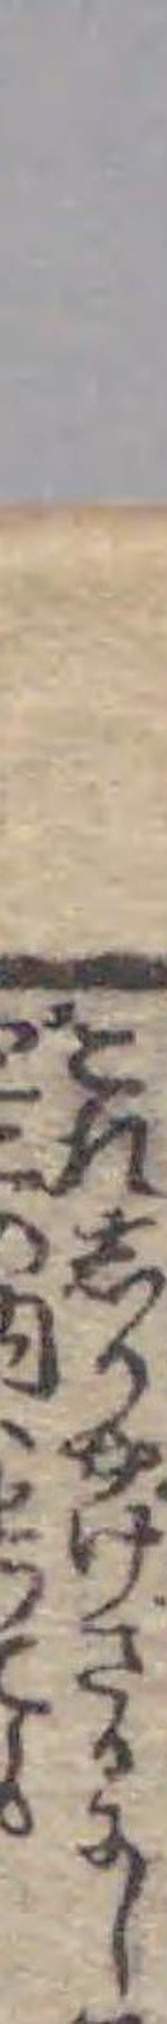これしりやけざるにして
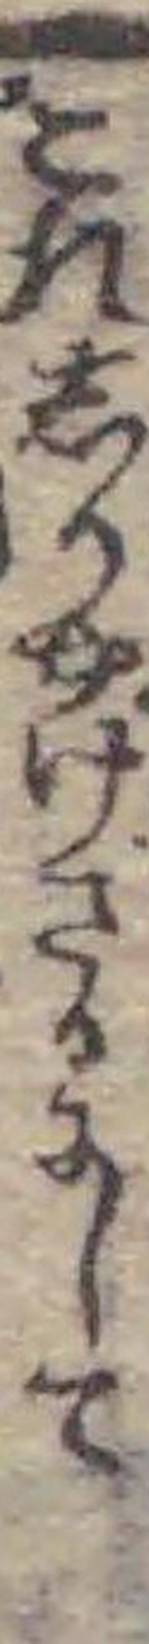これしりやけざるにして
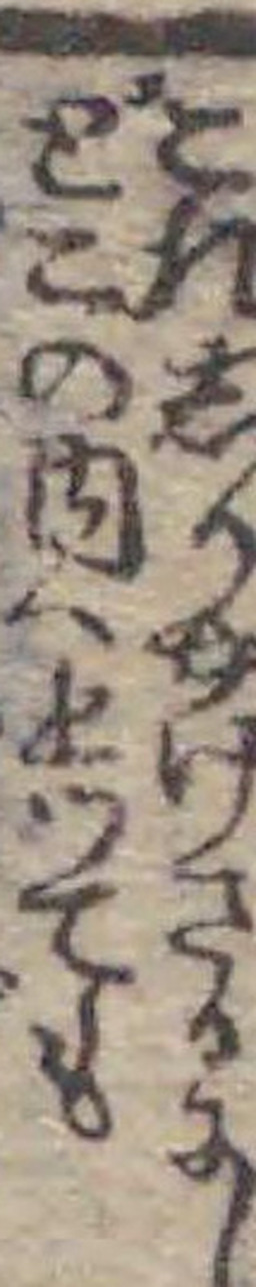どこの内へとつても
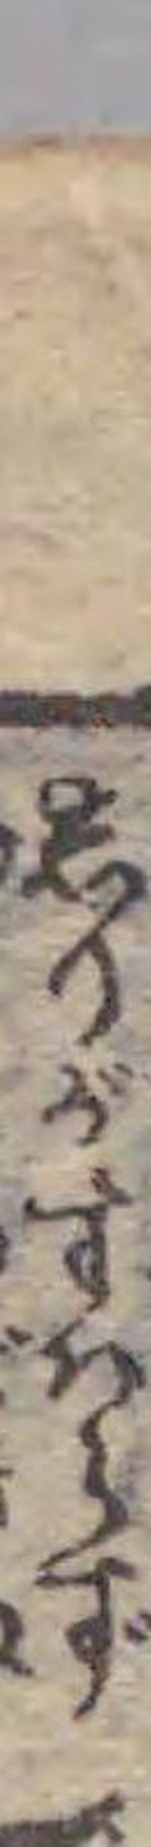しりがすはらず
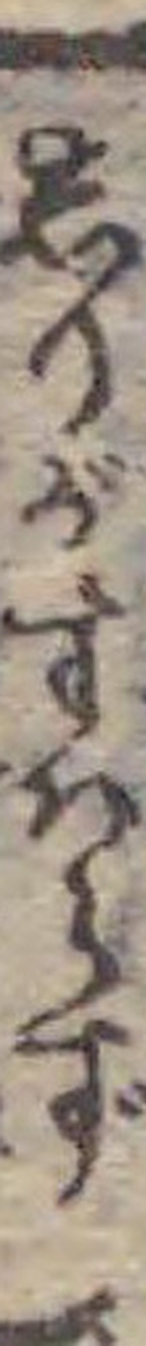しりがすはらず
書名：竜宮苦界玉手箱 : 3巻
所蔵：国立国会図書館 National Diet Library, JAPAN
